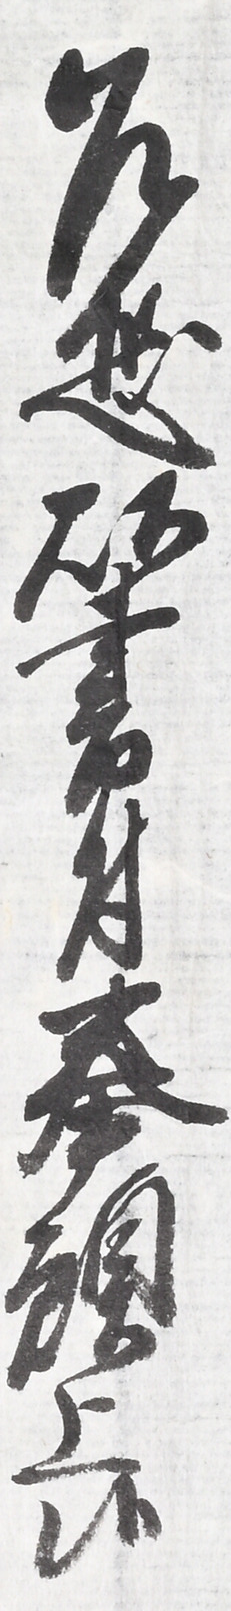乍恐以書付奉願上候
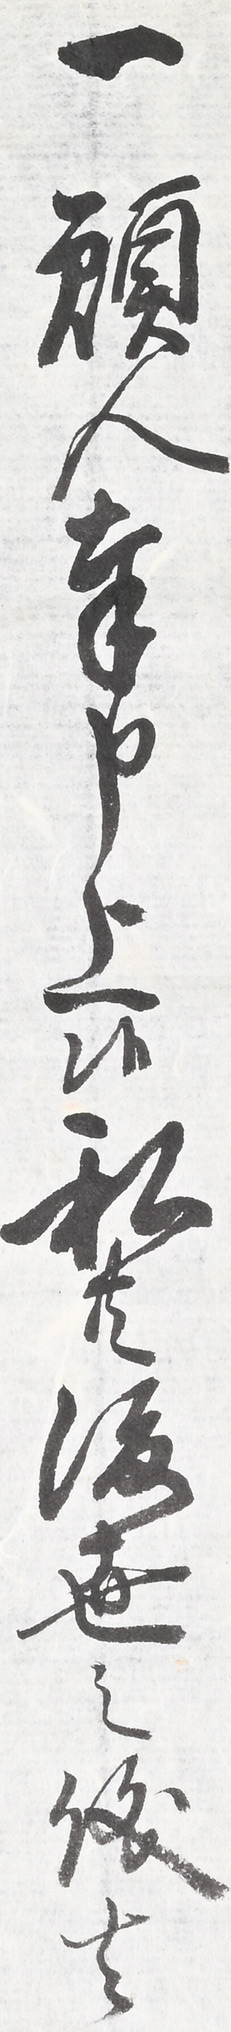一願人奉申上候私共渡世之儀者
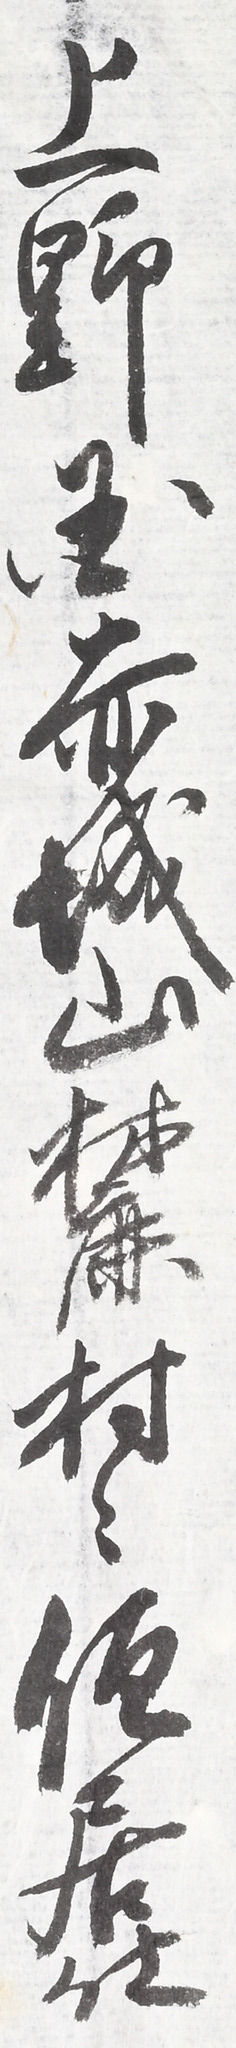上野国赤城山麓村々住居仕
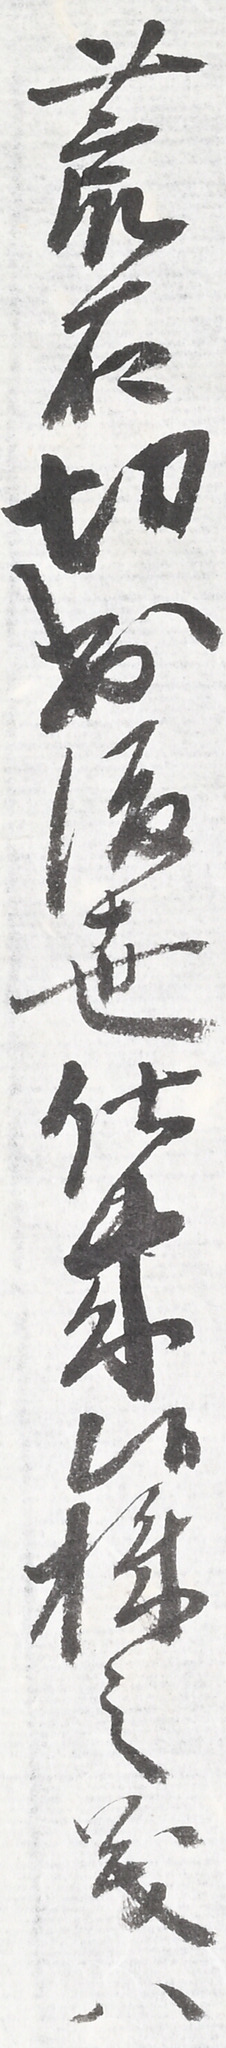荒石切出渡世仕来候株之義ハ
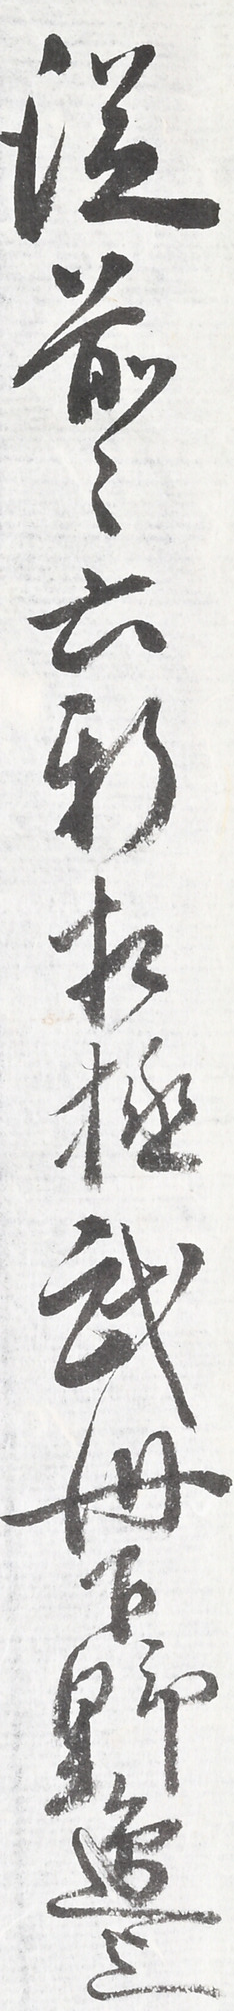従前々六軒相極武州下野辺迄
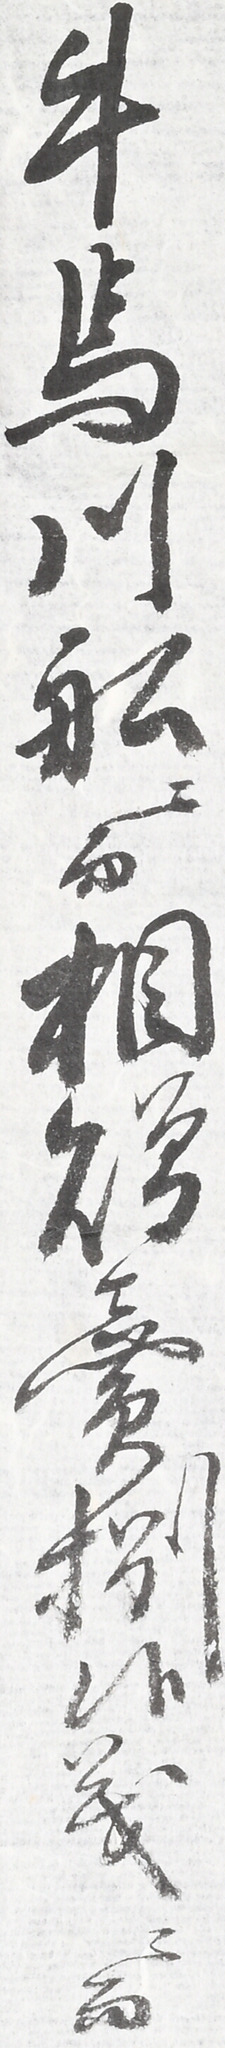牛馬川船ニ而相贈売捌候義ニ而
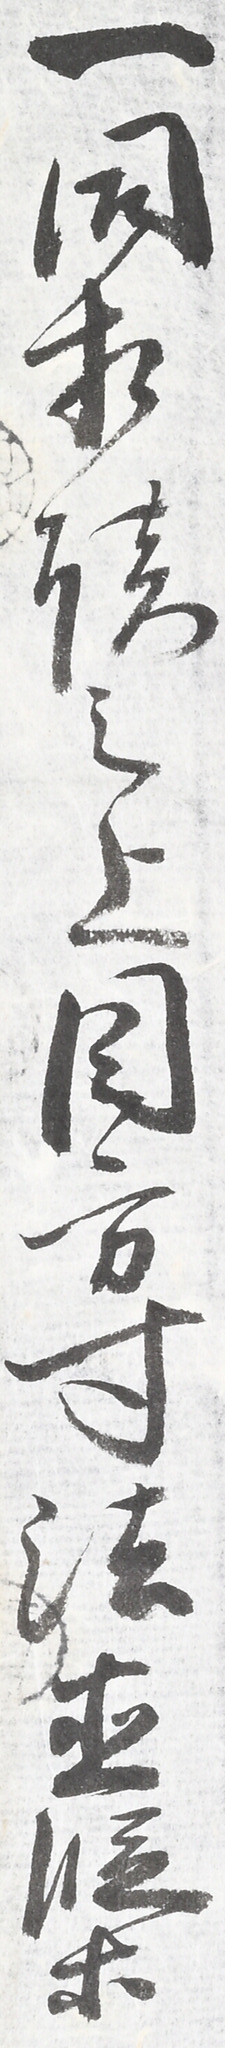一同相談之上目方寸法直段等
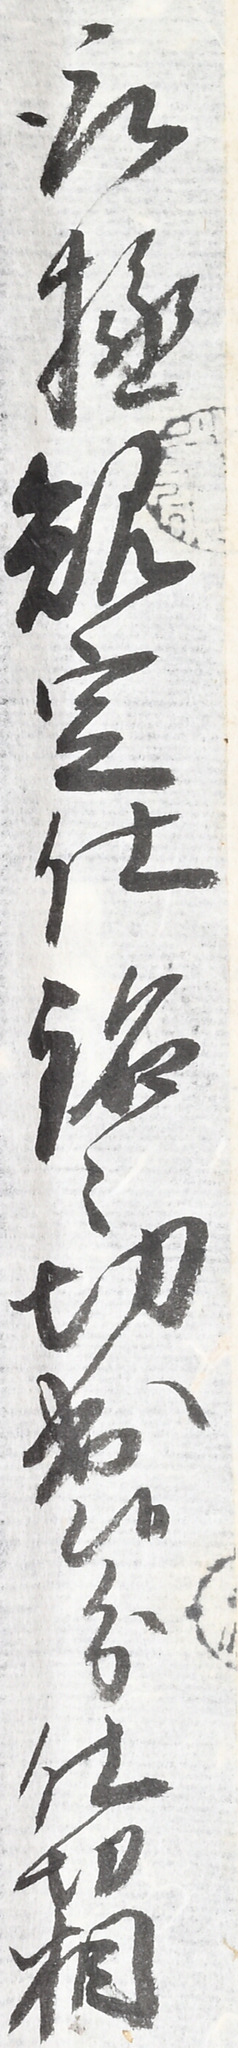取極規定仕銘々切出候分仕切相
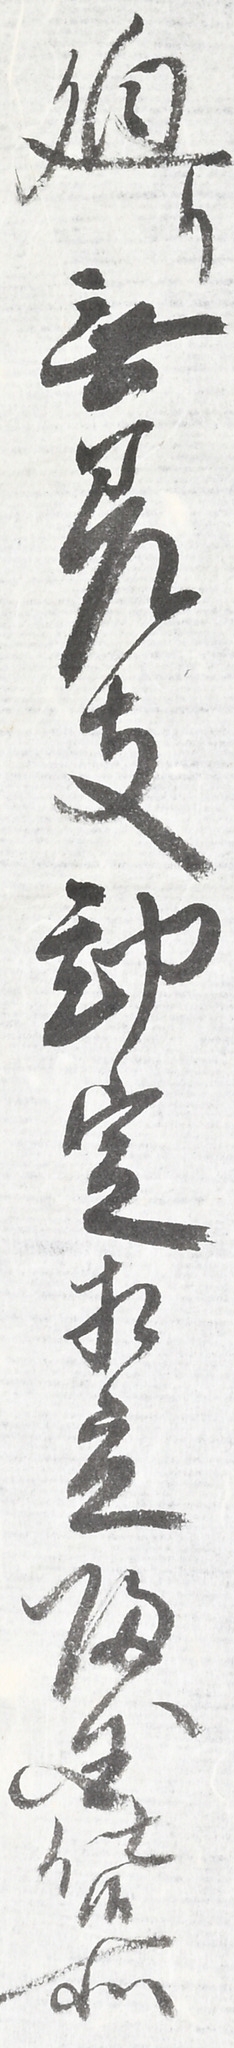廻り無差支勘定相立帰国仕候所
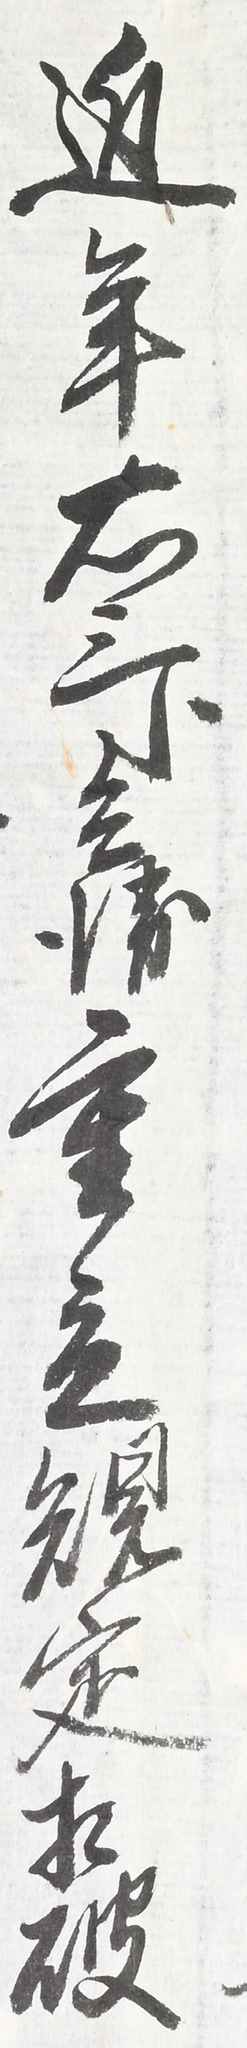近年右三郎兵衛重立規定相破
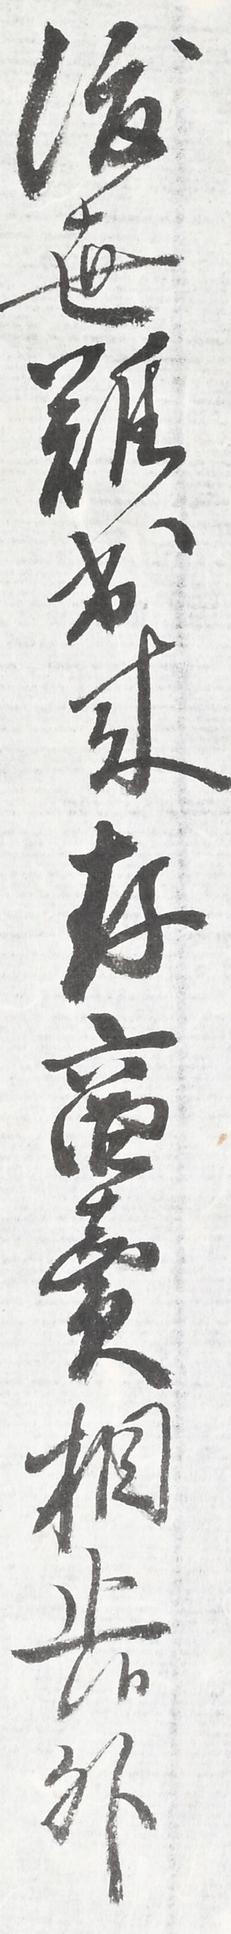渡世難出来存商売相止候外
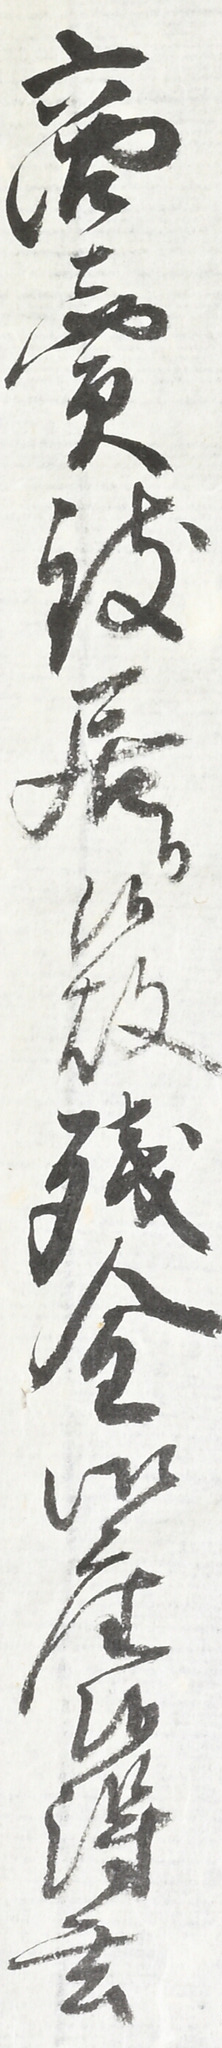商売致居り候故残金御座候得共
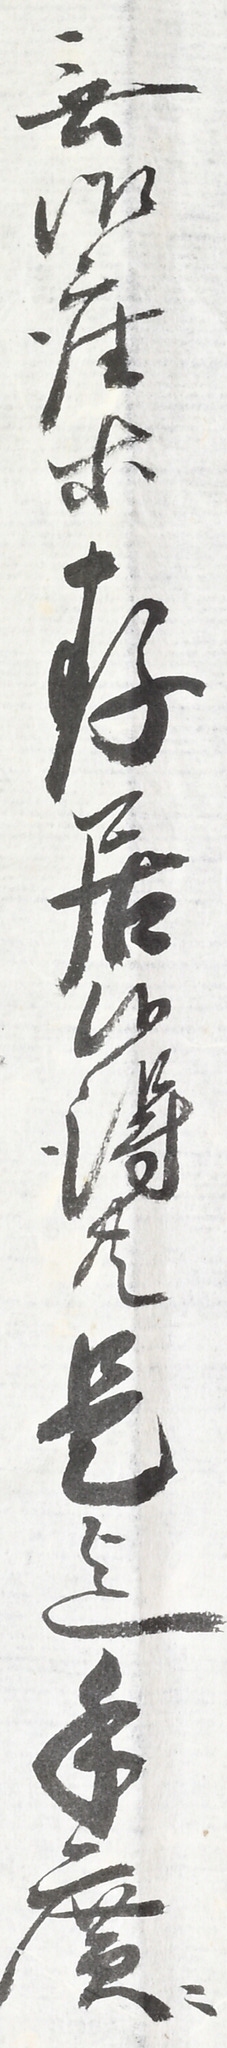無御座等存居候得共是迄手広ニ
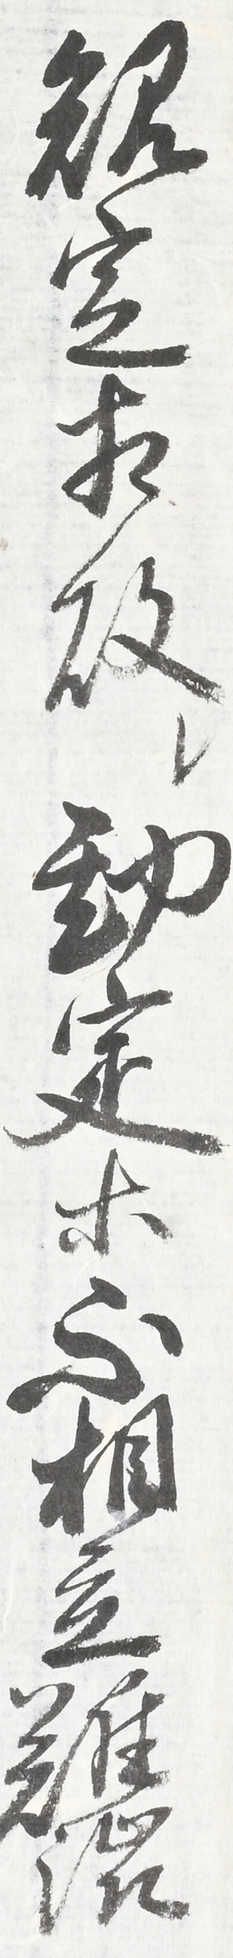規定相破レ勘定等不相立難渋
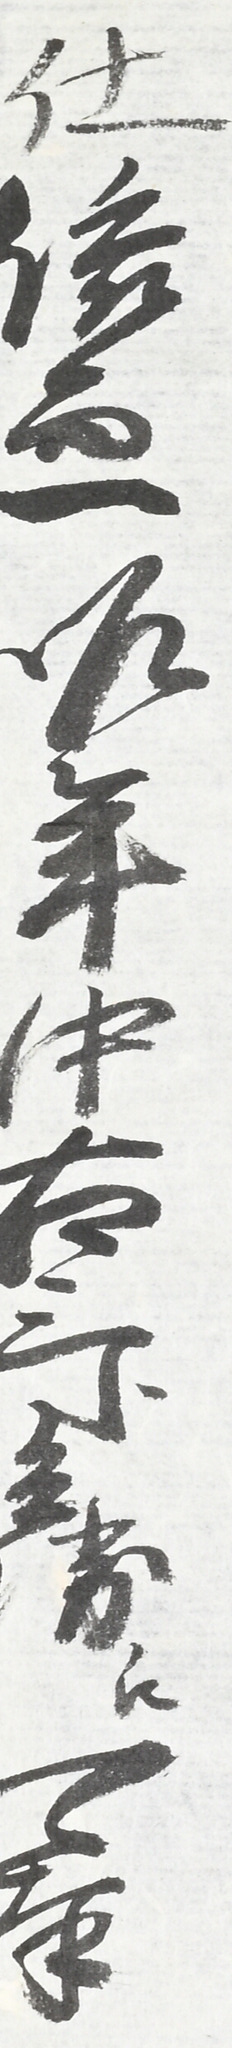仕依而一昨年中右三郎兵衛江可奉

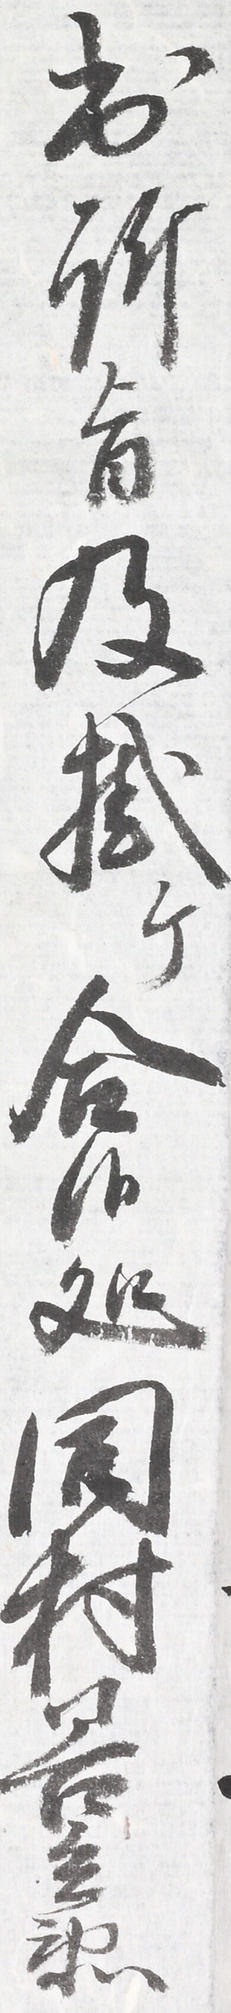出訴旨及掛ケ合候処同村善兵衛
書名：乍恐以書付奉願上候
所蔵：伊那市立高遠町図書館・合同会社AMANE
